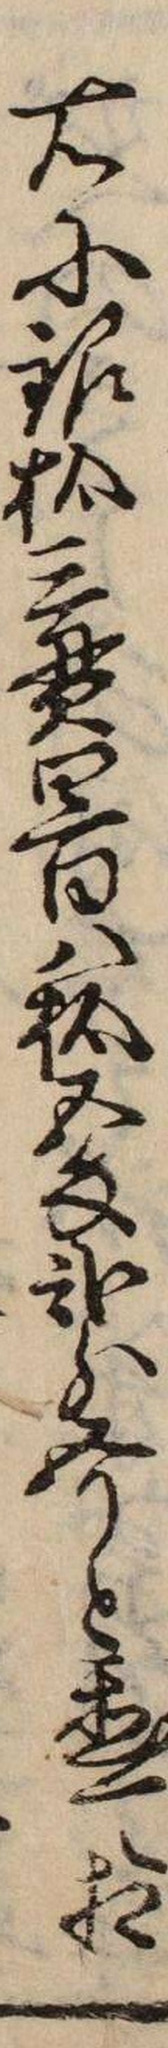右に銀拾三貫四百八拾五匁弐分五りと置相
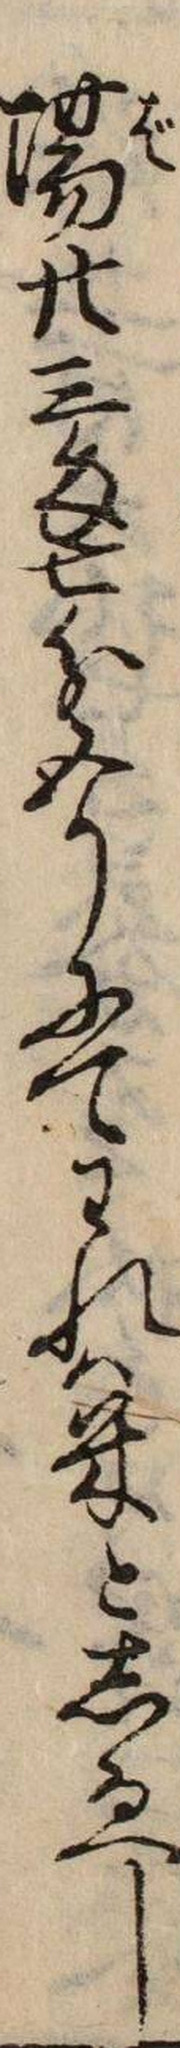場廿三匁七分五りにてわれは米としるへし
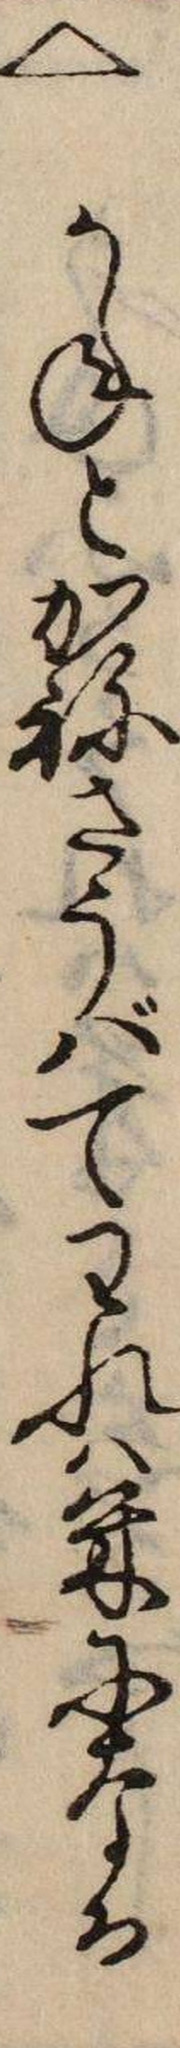△かねとかねさうばてわれは米になる
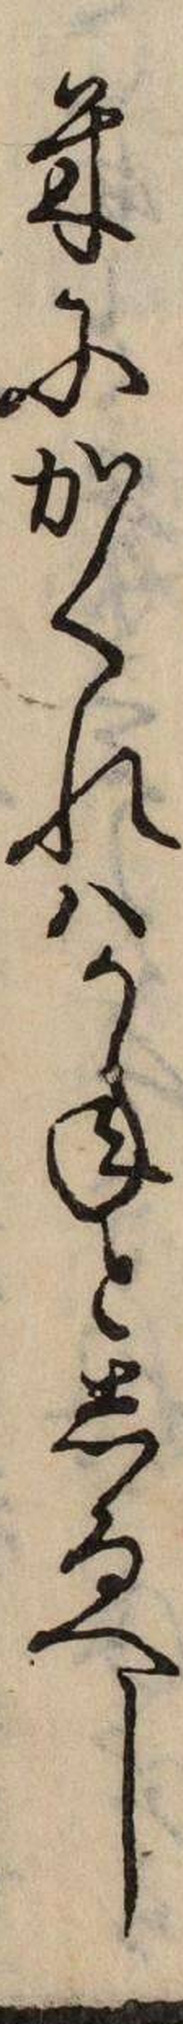米にかくれはかねとしるへし
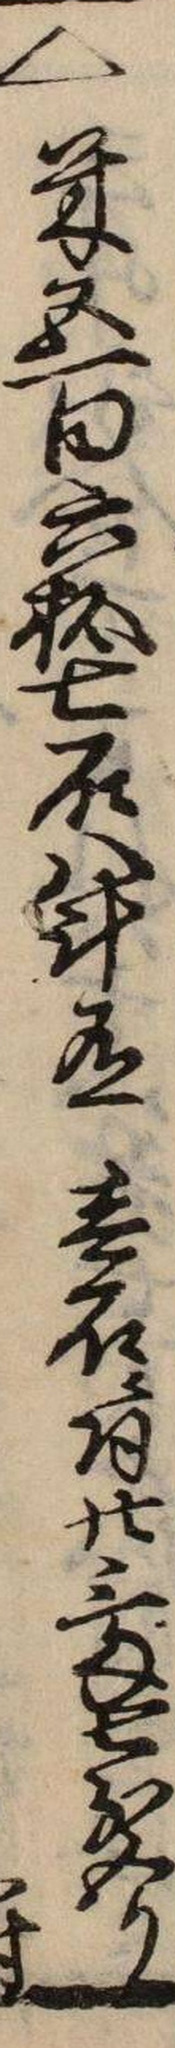△米五百六拾七石八斗有壱石に付廿三匁七分五厘
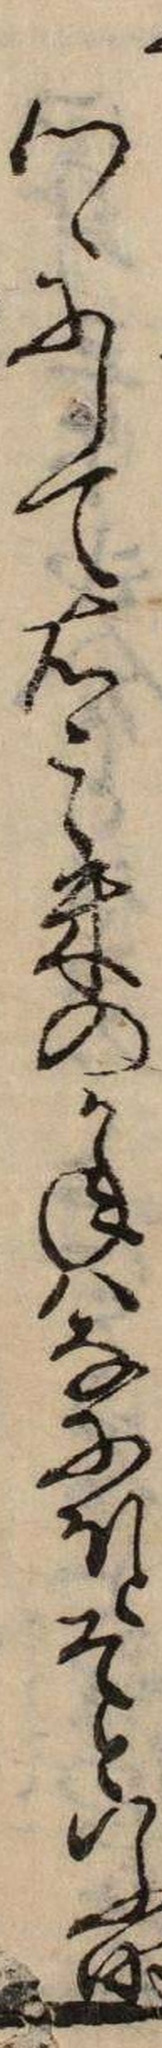つゝにして右の米のかねはなにほとそといふ時
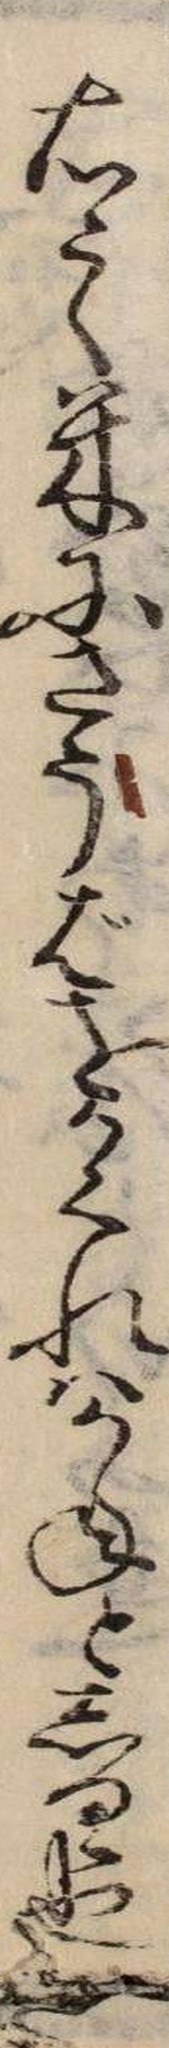右の米にさうばをかくれはかねとしるゝ也
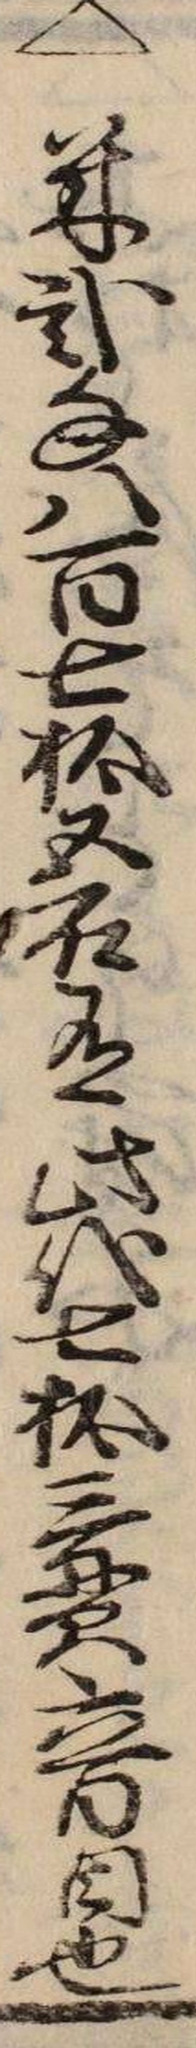△米弐千八百七拾五石有此代七拾三貫六百目也
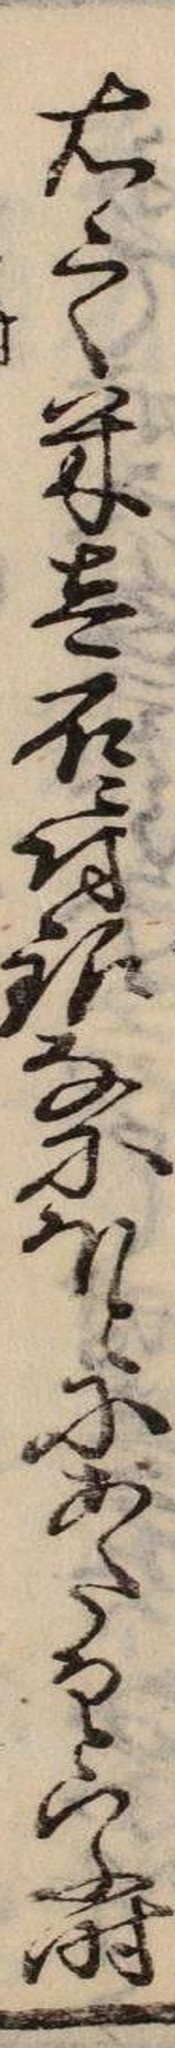右之米壱石に付銀なにほとにあたるといふ時
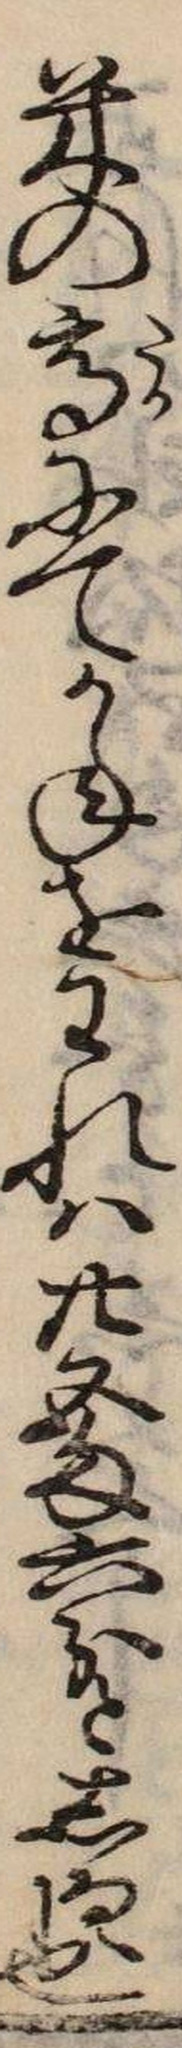米の高にてかねをわれは廿五匁六分としるゝ也
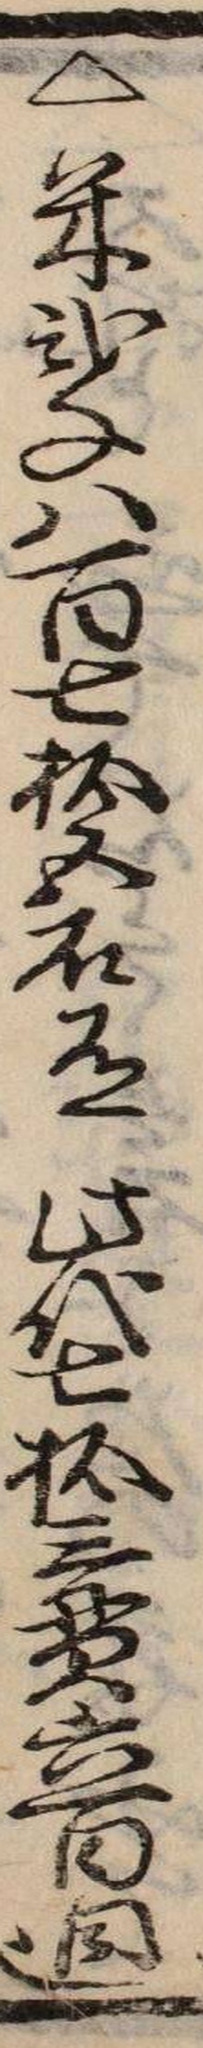△米弐千八百七拾五石有此代七拾三貫六百目也
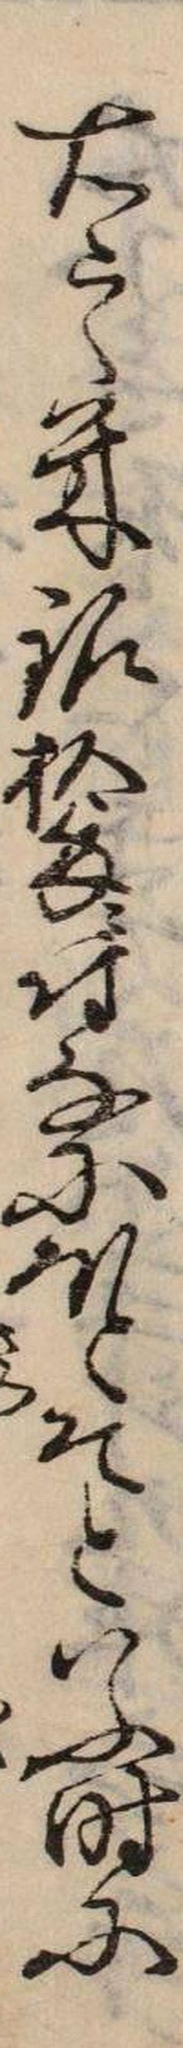右の米銀拾匁に付なにほとそといふ時に
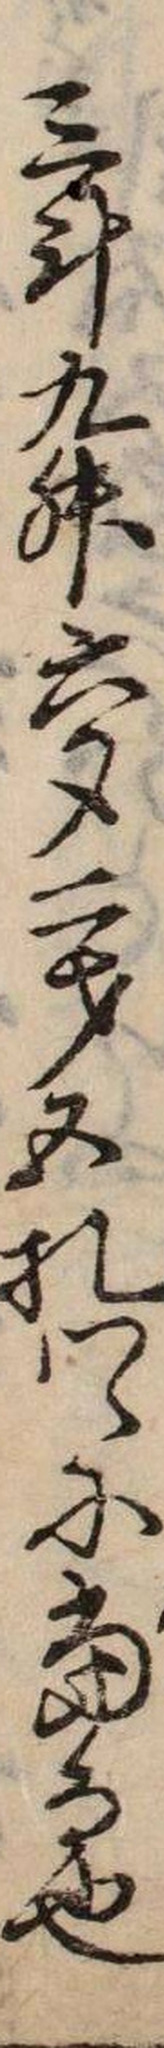三斗九舛六勺二才五札つゝに当る也
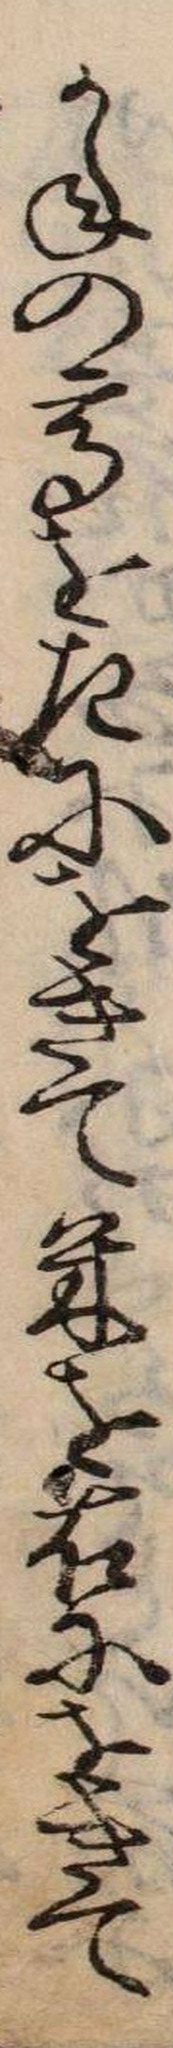かねの高を左にをきて米を右にをきて
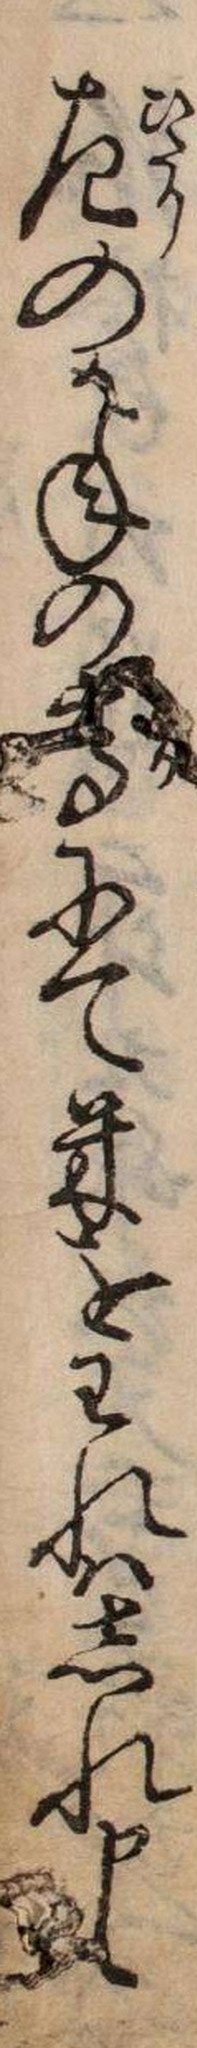左のかねの高にて米をわれはしれ申候

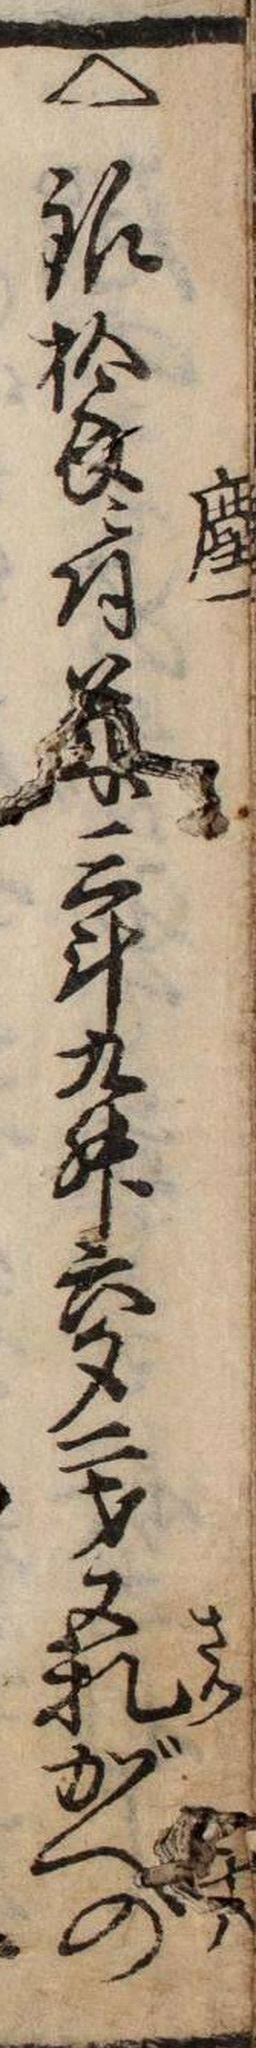銀拾匁に付米三斗九舛六勺二才五札がへの
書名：塵劫記（寛永11年自跋、京都府立京都学・歴彩館追貴8）
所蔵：京都府立京都学・歴彩館 国文学研究資料館
